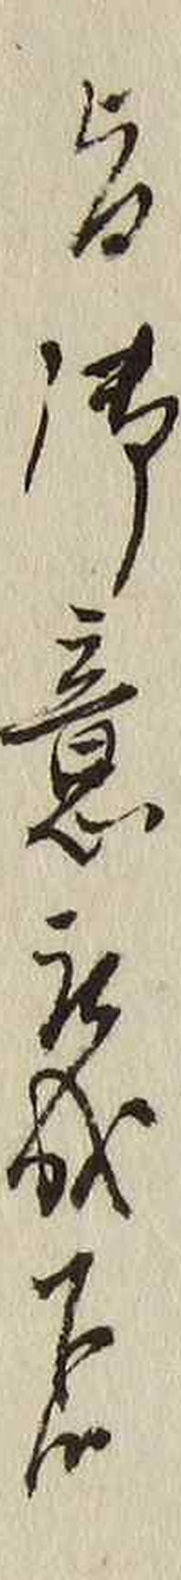旨御意被成下候
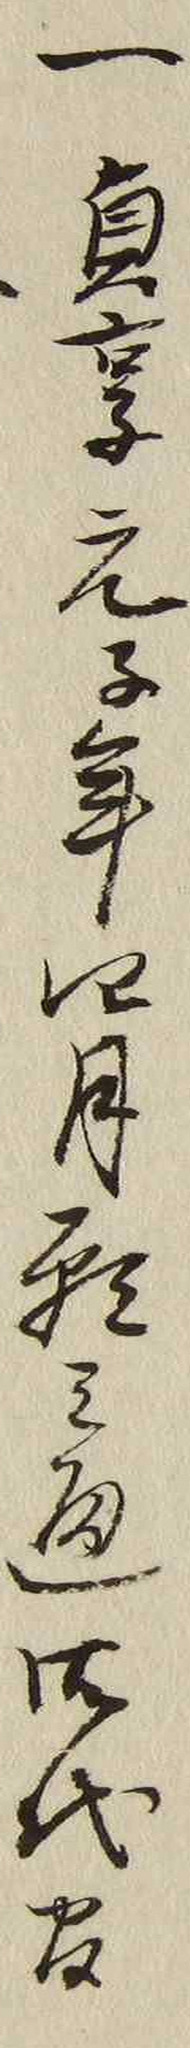一貞享元子年四月願之通御代官
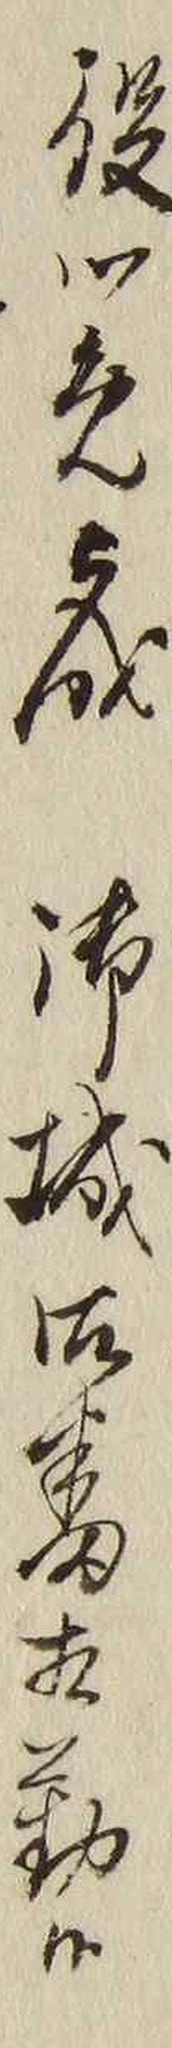役御免被成御城御番相勤候
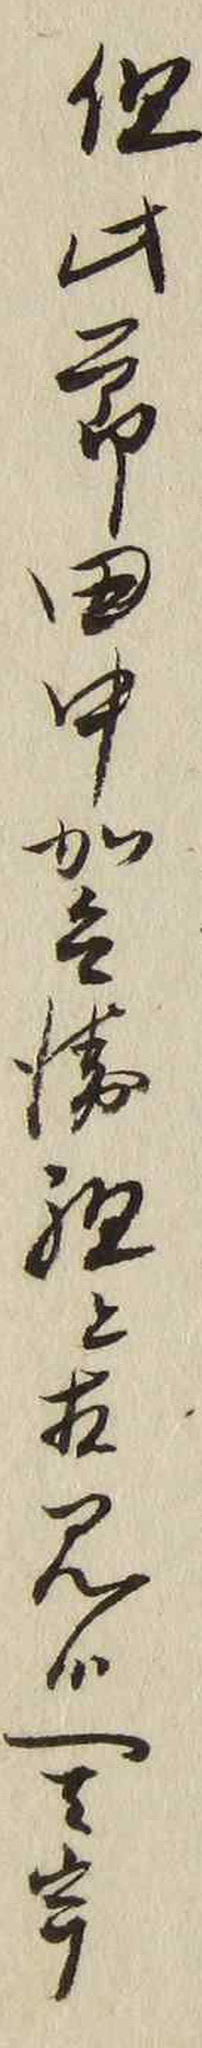但此節田中加兵衛組と相見候へ者宇

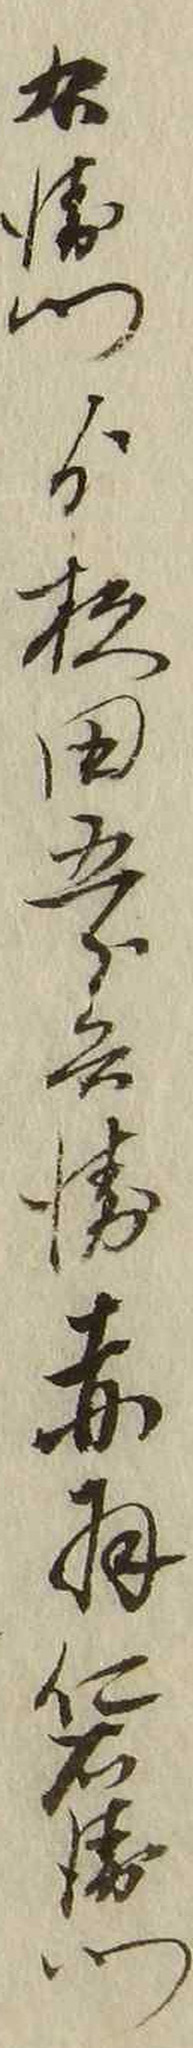右衛門ゟ杉田五郎兵衛赤羽仁右衛門
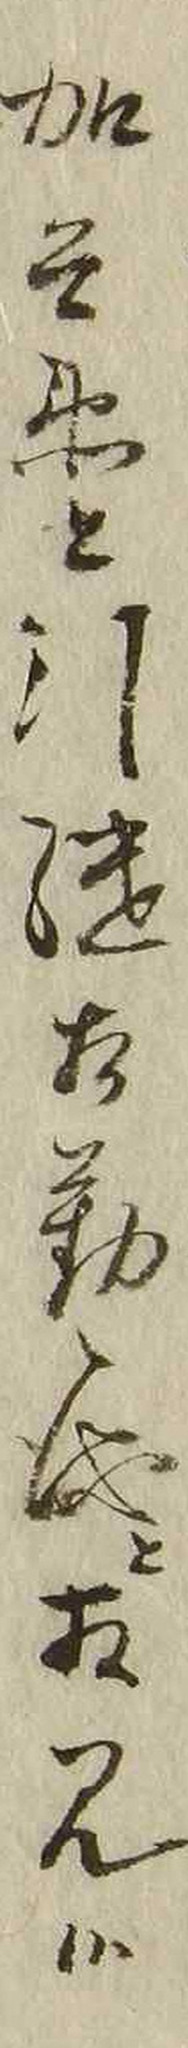加兵衛と引継相勤候儀と相見候
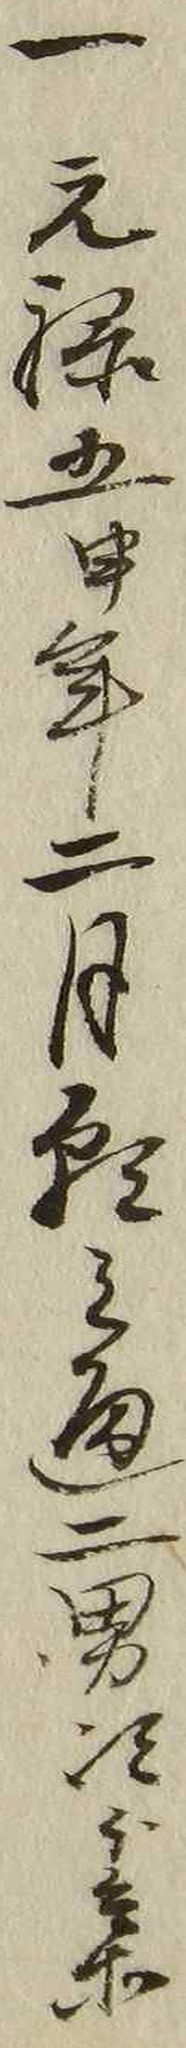一元録五申年二月願之通二男次郎兵衛
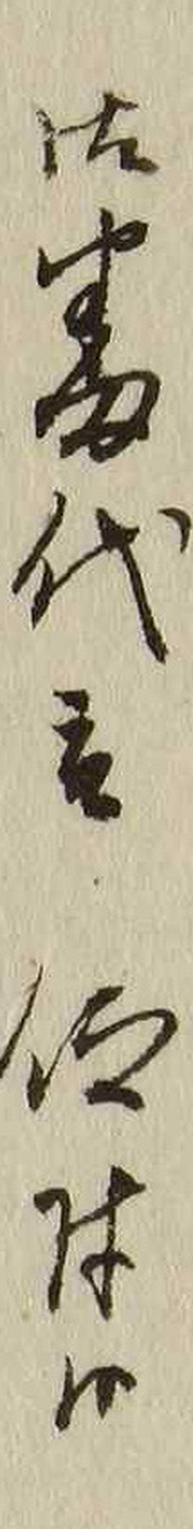御番代被仰付候
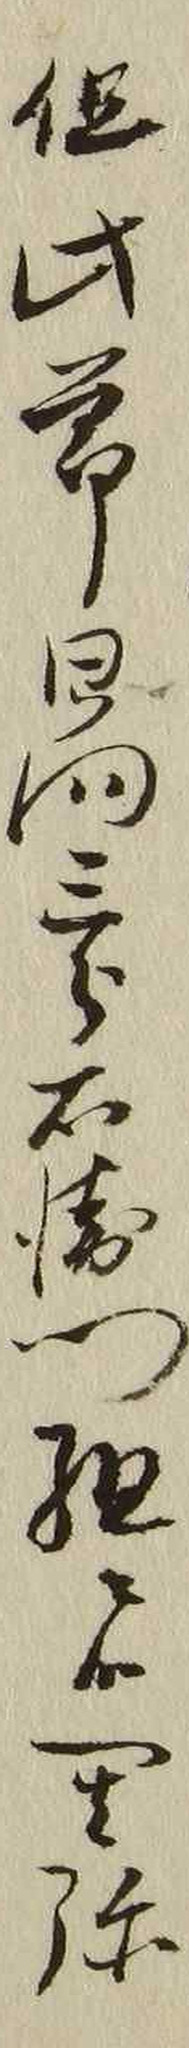但此節日向三郎右衛門組ニ候へ者弥
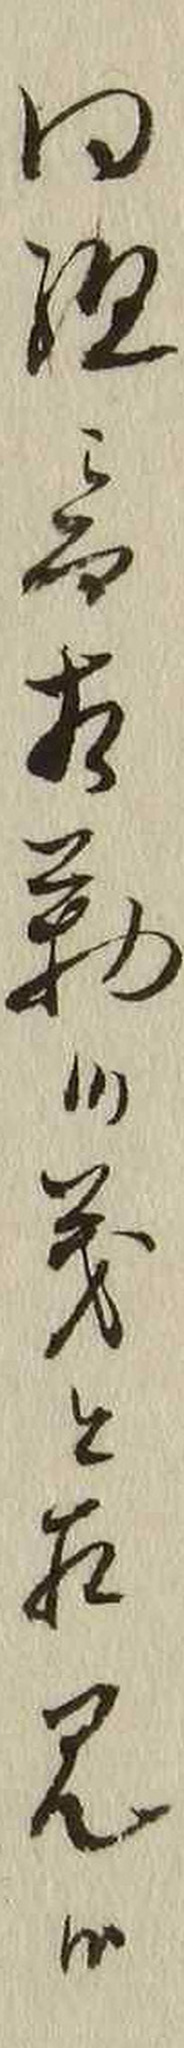同組ニ而相勤候義と相見候
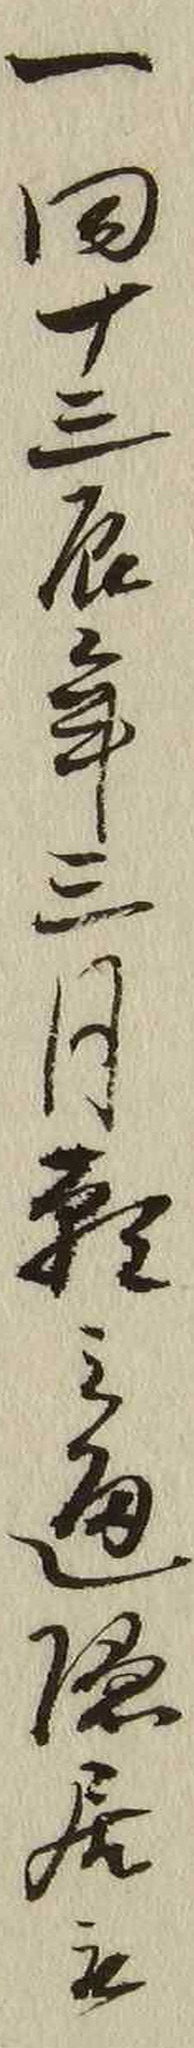一同十三辰年三月願之通隠居被
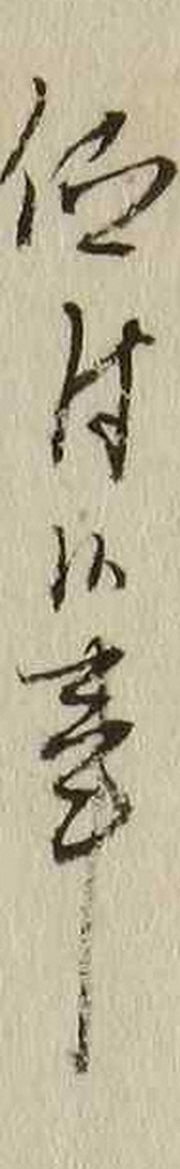仰付候事
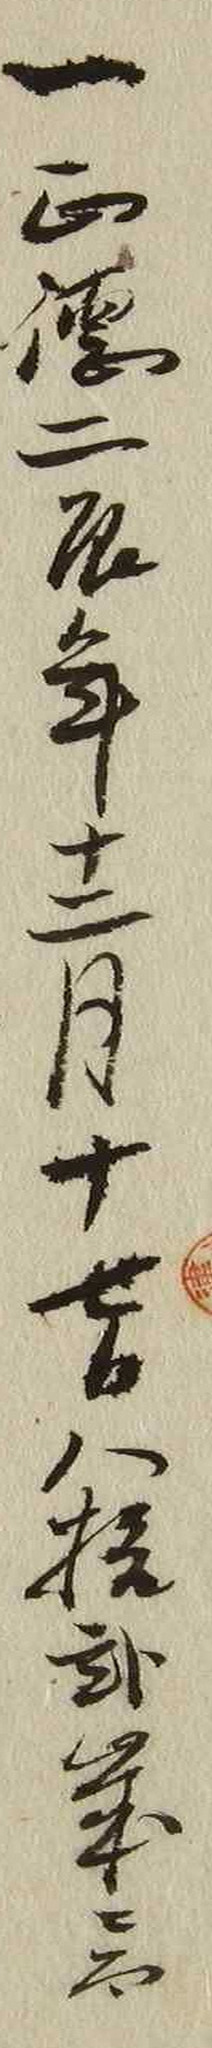一正徳二辰年十二月十七日八拾弐歳ニ而
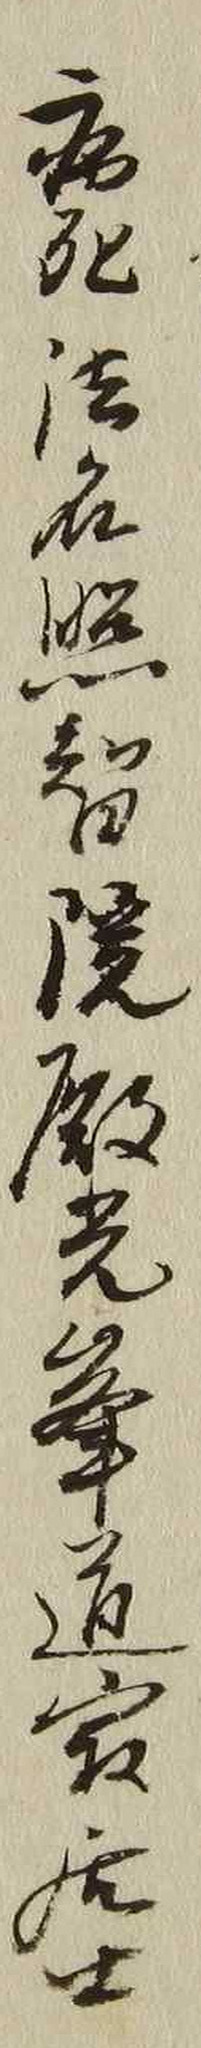病死法名照智院殿光峯道最居士
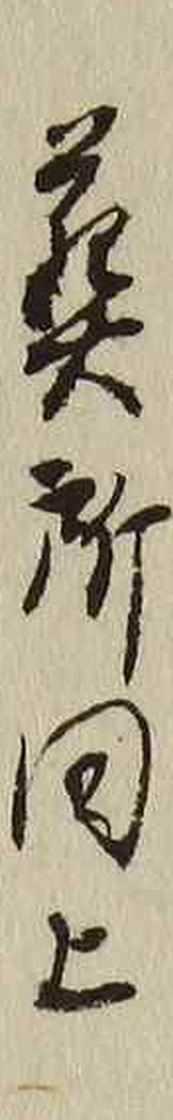葬所同上
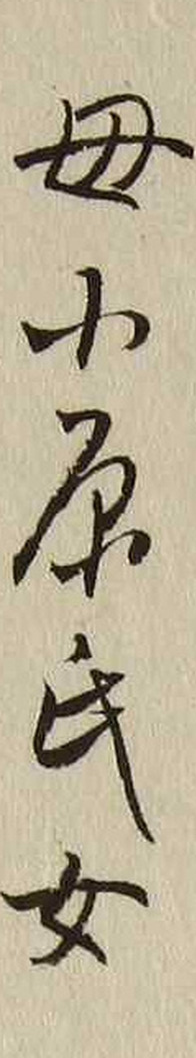母小原氏女
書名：諸士系譜　巻之359　す之部9
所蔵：会津若松市立会津図書館
